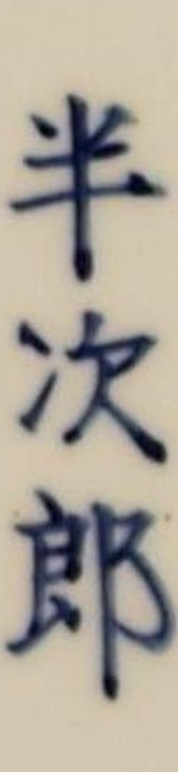半次郎
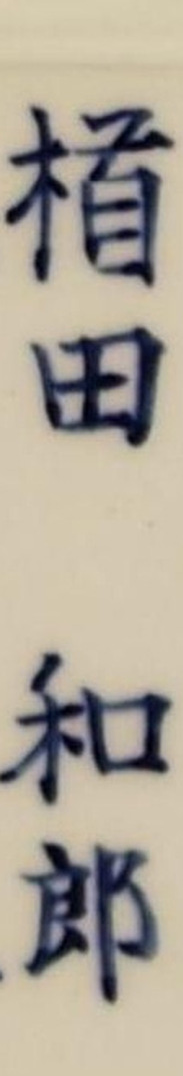楯田和郎
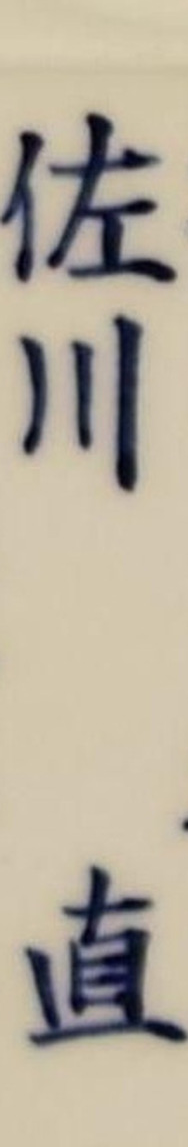佐川直
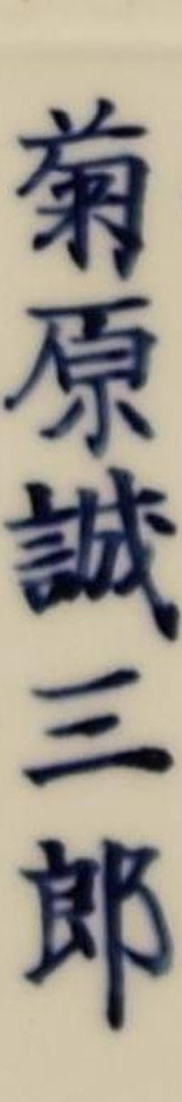菊原誠三郎
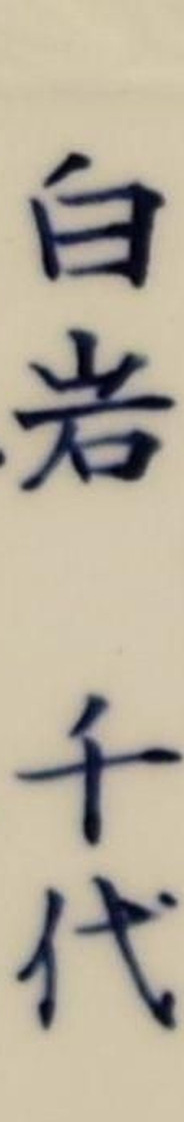白岩千代
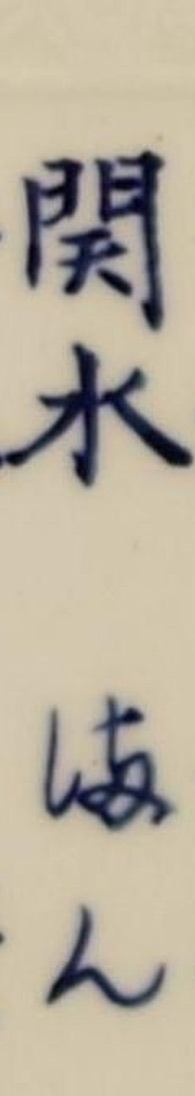開水まん
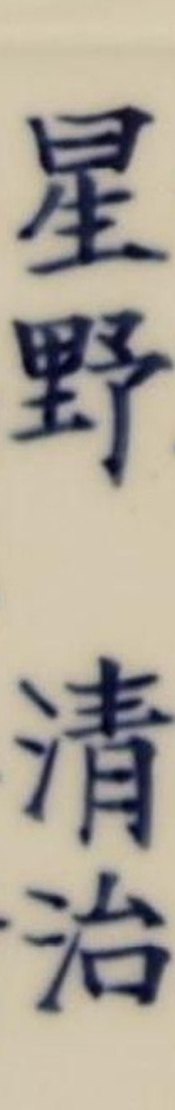星野清治
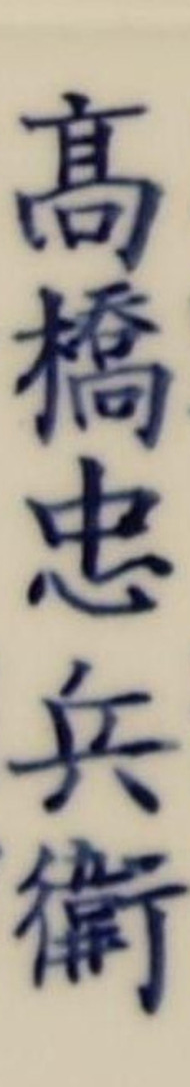高橋忠兵衛
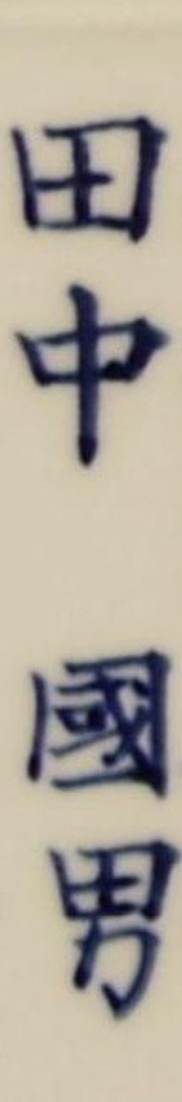田中国男
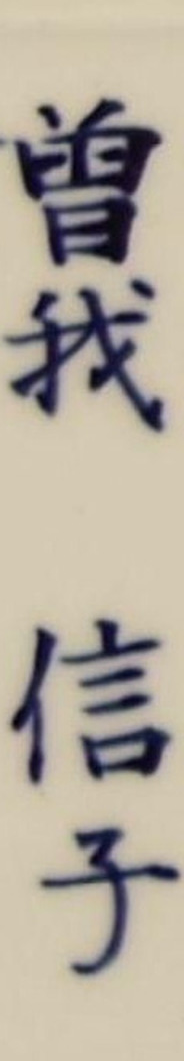曽我信子
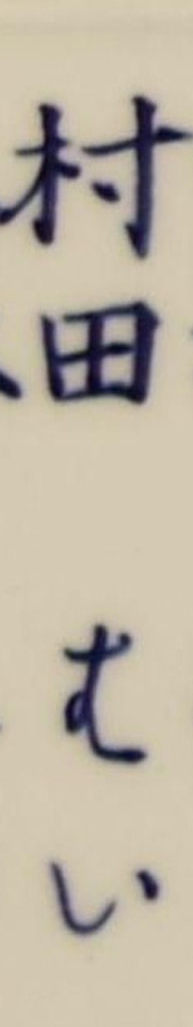村田はい
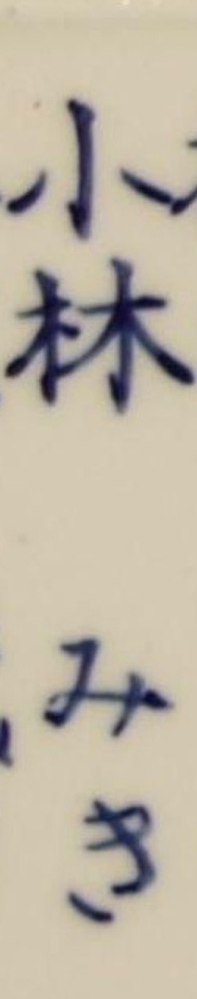小林みき
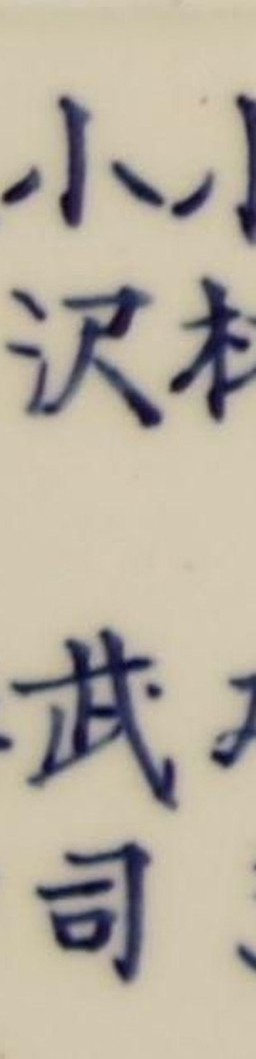小沢武司
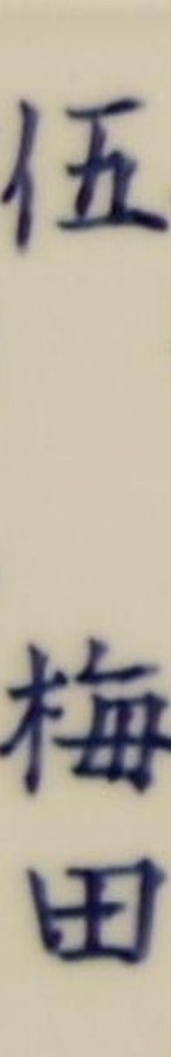伍梅田
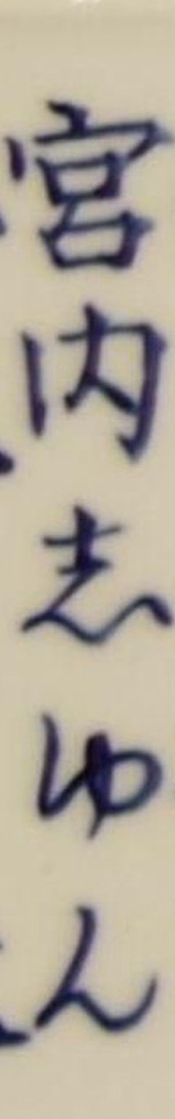宮内しゆん
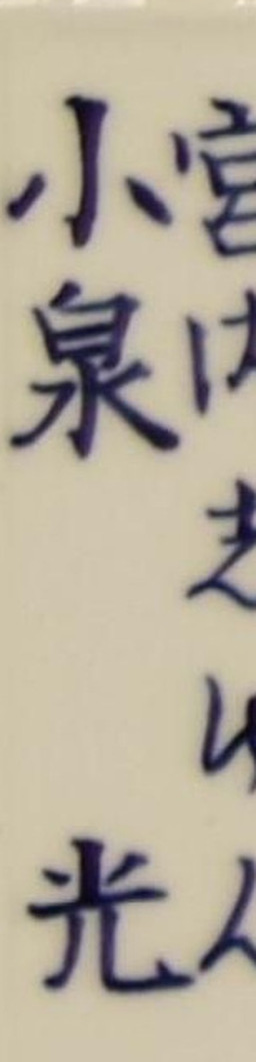小泉光
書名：A~D
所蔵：koyasan kongobuji
